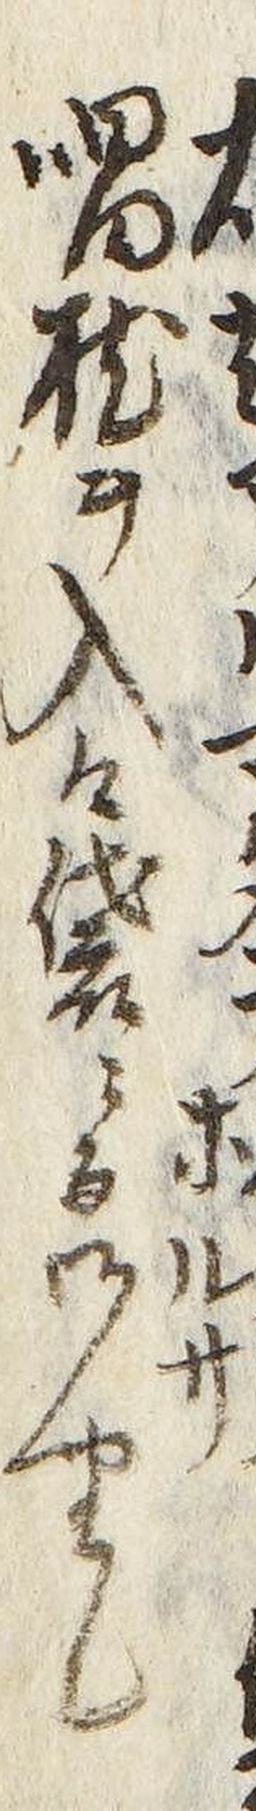唱枕ヲ入候袋ニ而御座候

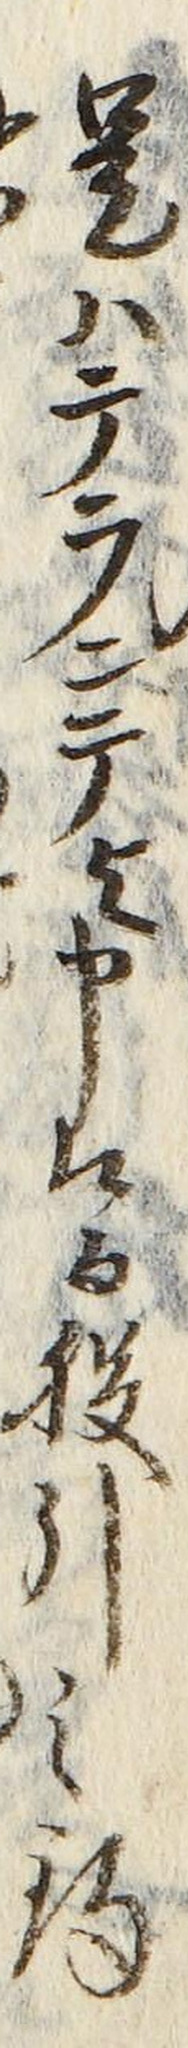是ハテランテと申候而股引之釣
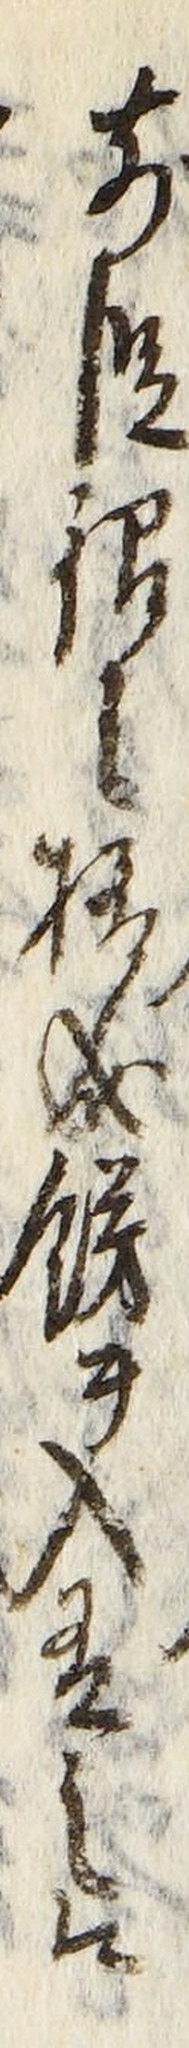前段銀之様成餝ヲ入有之候
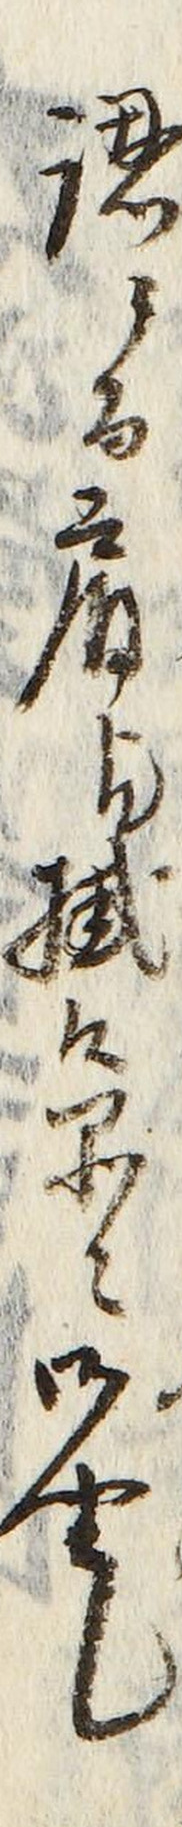認ニ而肩江掛候品ニ御座候
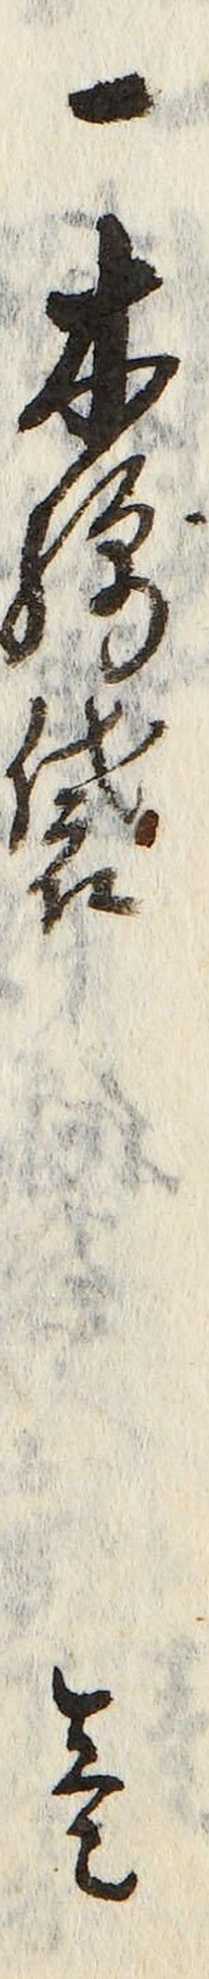一木綿袋壱
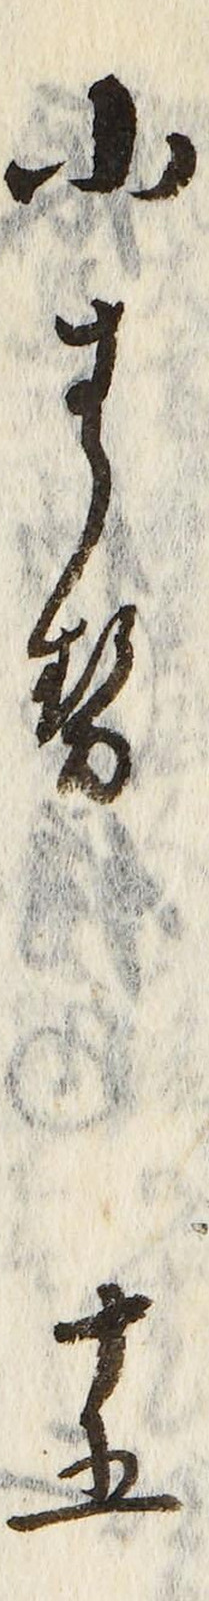小すせ十五
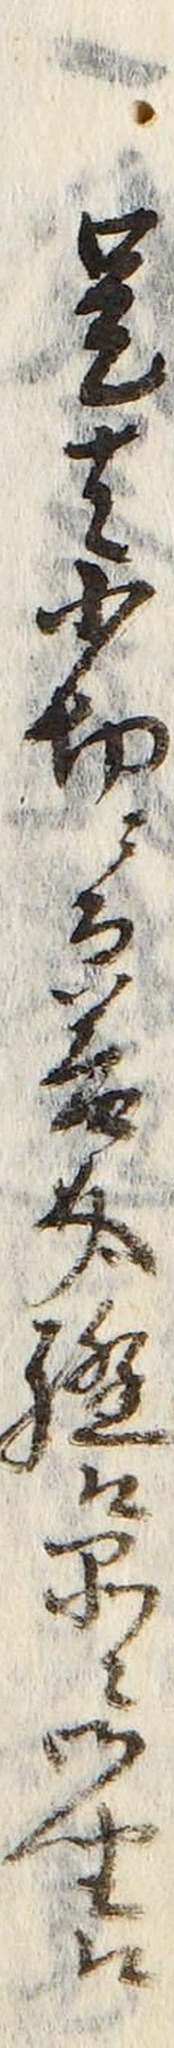是者小切ニ而善介縫候品ニ御座候
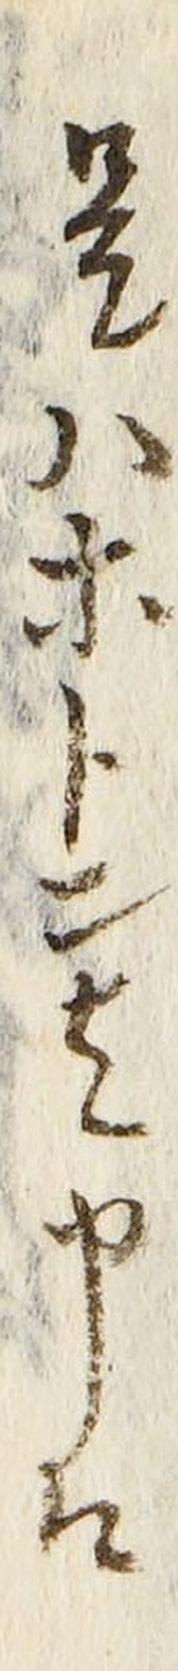是ハホトンと申候
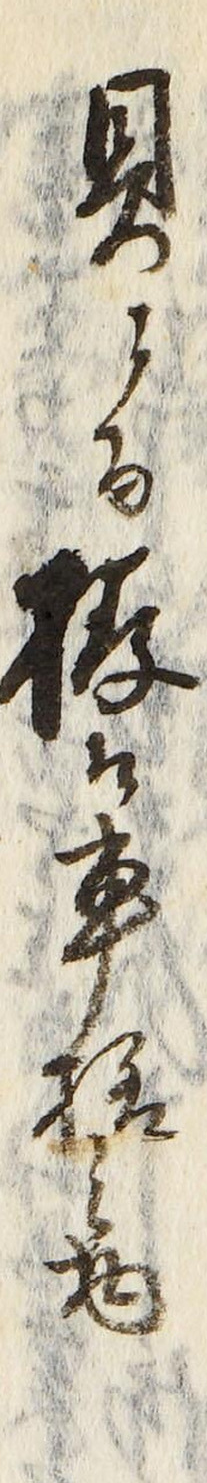貝ニ而拵候車様之物一
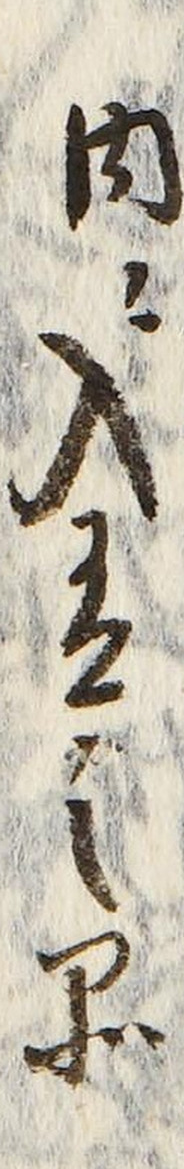内ニ入有之品
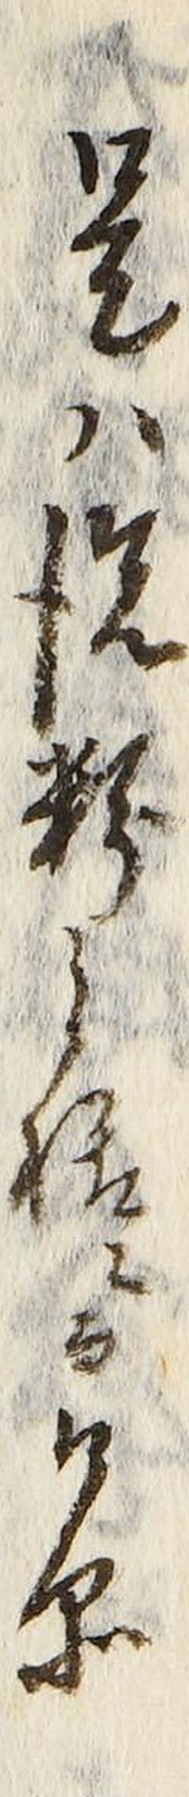是ハ洗粉之様ニ而候品
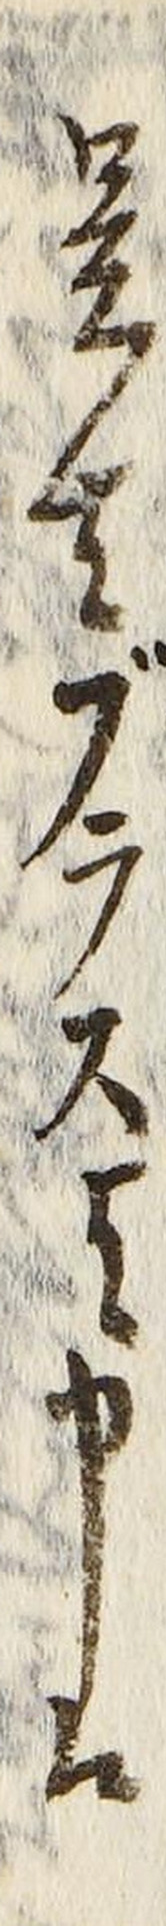是者ブラスと申候
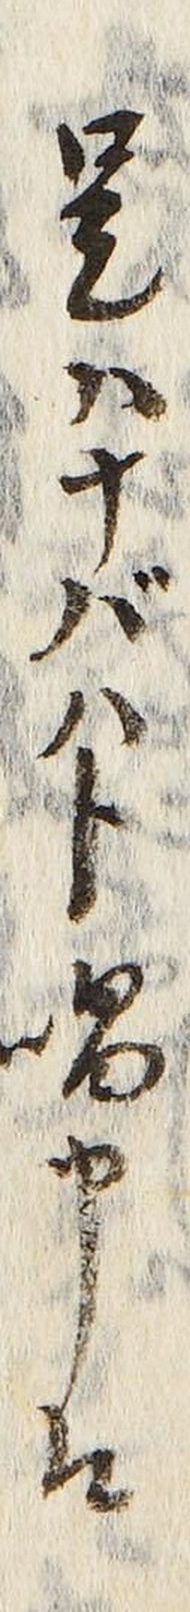是ハナバハト唱申候
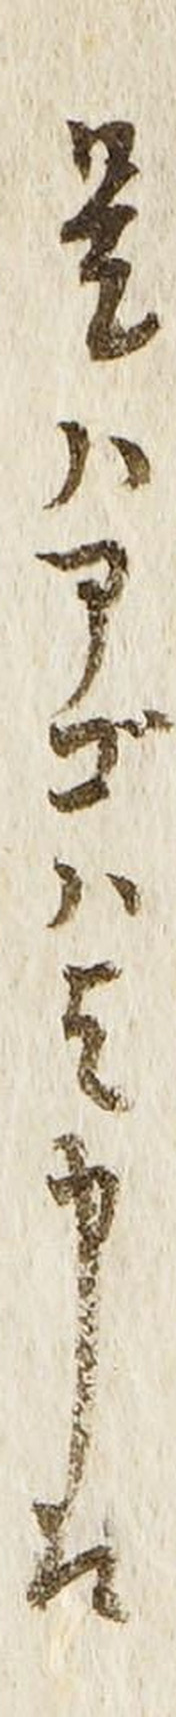是ハアゴハと申候
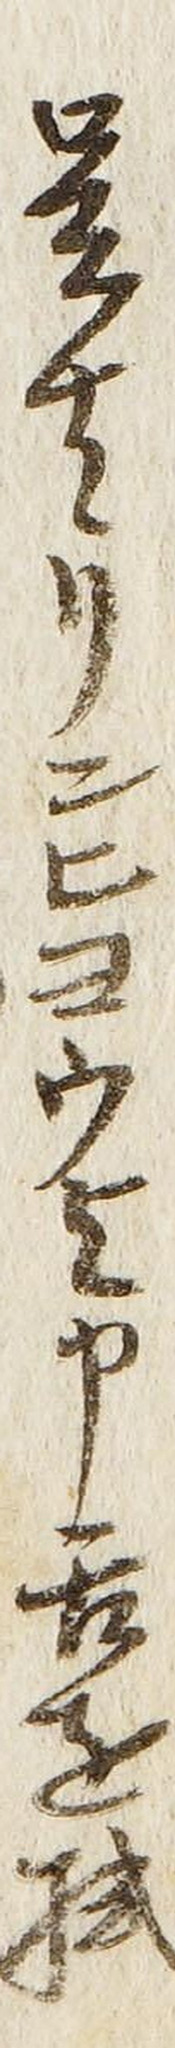是者リンヒヨウと申舌を拭
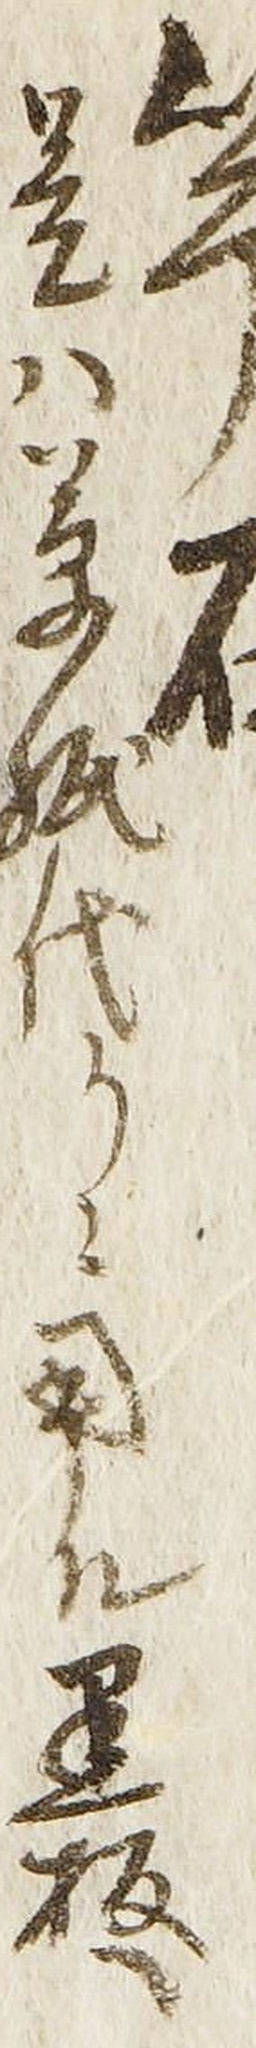是ハ草紙代りニ用ル黒板へ
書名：漂流人善助聞書
